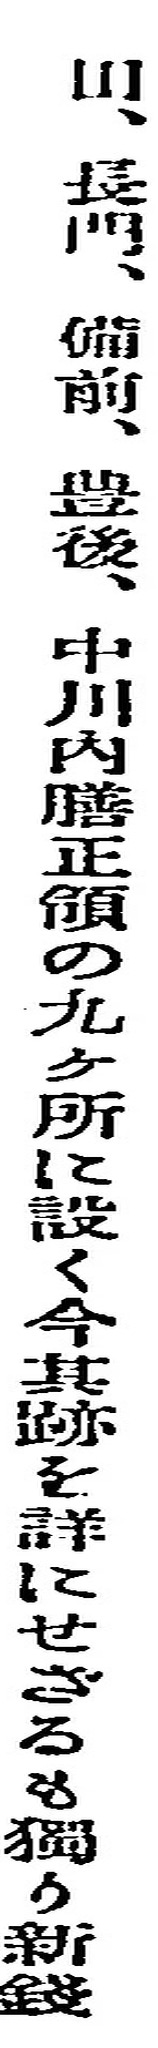田、長門、備前、豊後、中川内膳正領の九ヶ所に設く今其跡を詳にせざるも獨り新錢
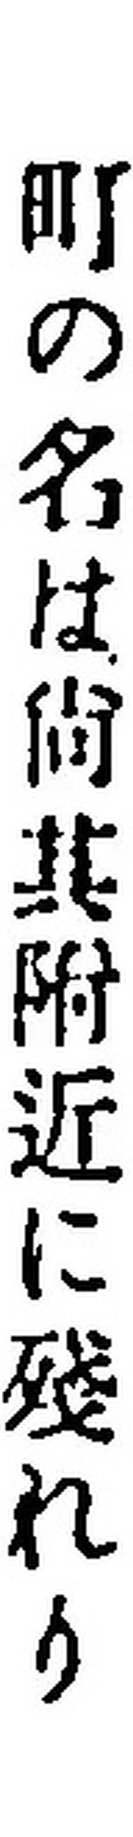町の名は尚其附近に殘れり
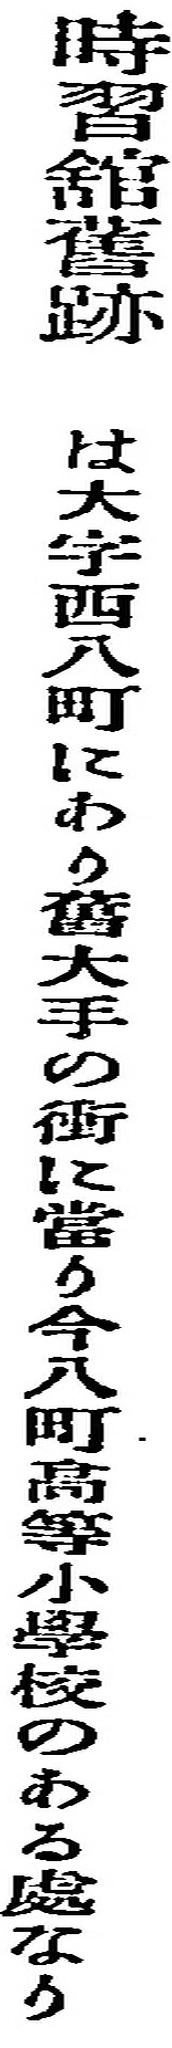時習舘舊跡は大字西八町にあり舊大手の衝に當り今八町高等小學校のある處なり
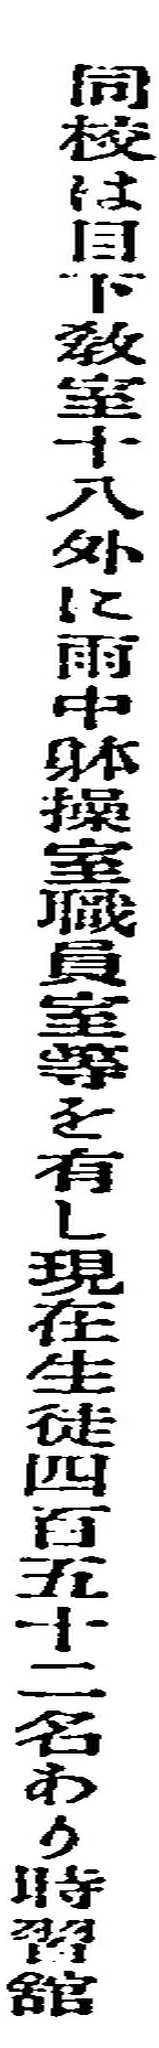同校は目下敎室十八外に雨中躰操室職員室等を有し現在生徒四百五十二名あり時習舘
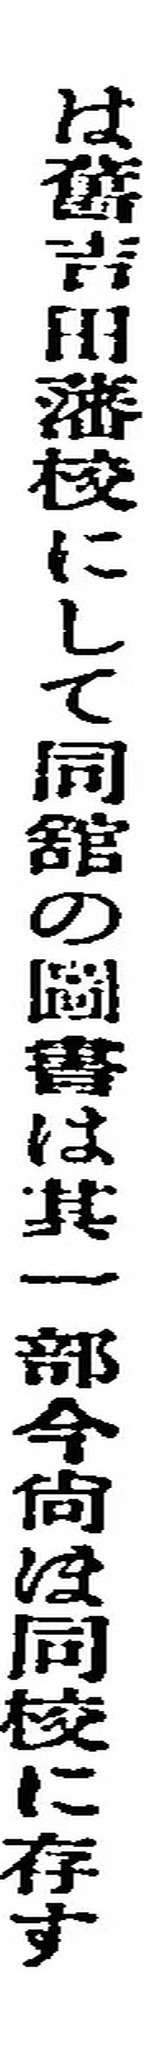は舊吉田藩校にして同舘の圖書は其一部今尚ほ同校に存す
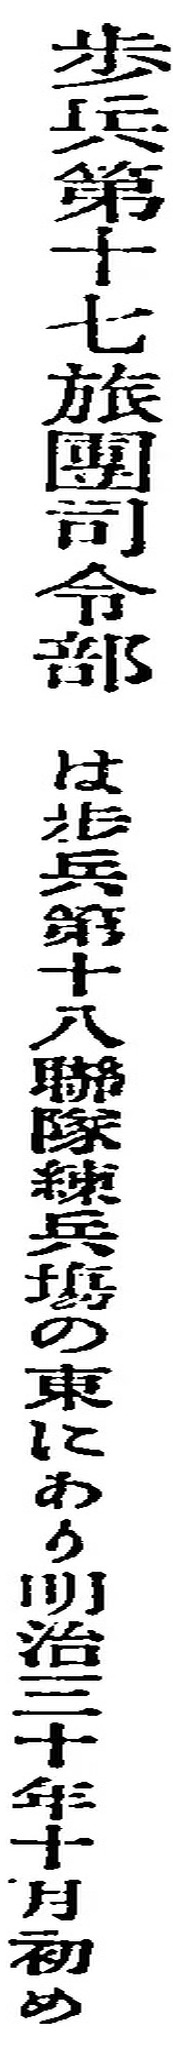歩兵第十七旅團司令部は歩兵第十八聯隊練兵場の東にあり明治三十年十月初め
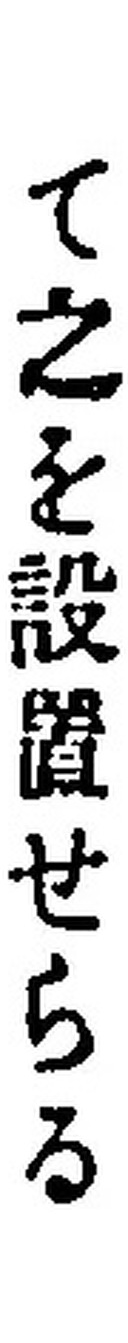て之を設置せらる
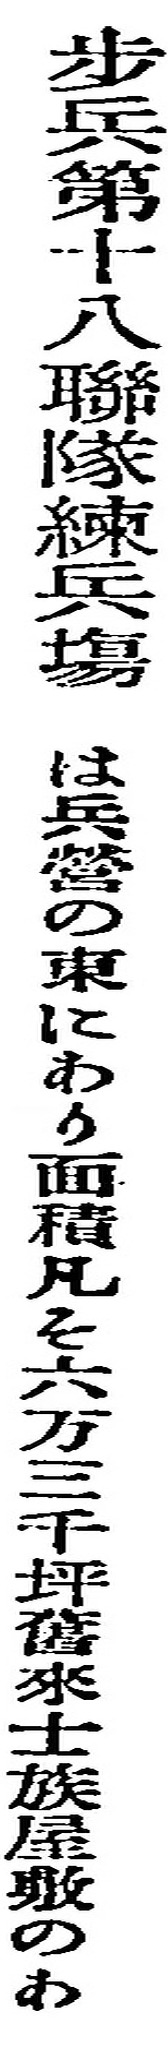歩兵第十八聯隊練兵場は兵營の東にあり面積凡そ六万三千坪舊來士族屋敷のあ
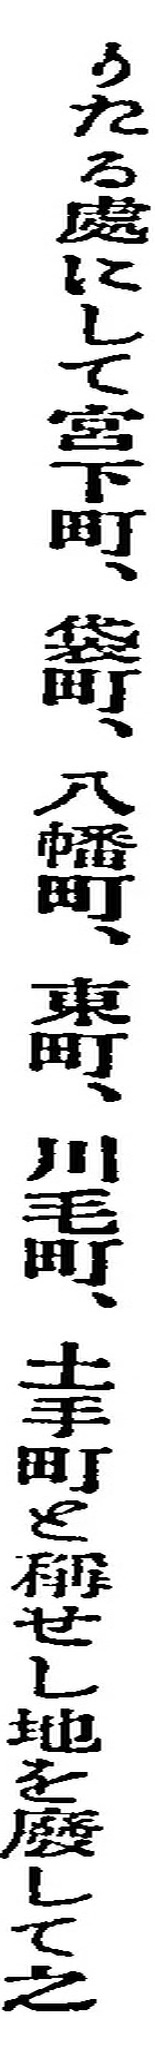りたる處にして宮下町、袋町、八幡町、東町、川毛町、土手町と稱せし地を廢して之
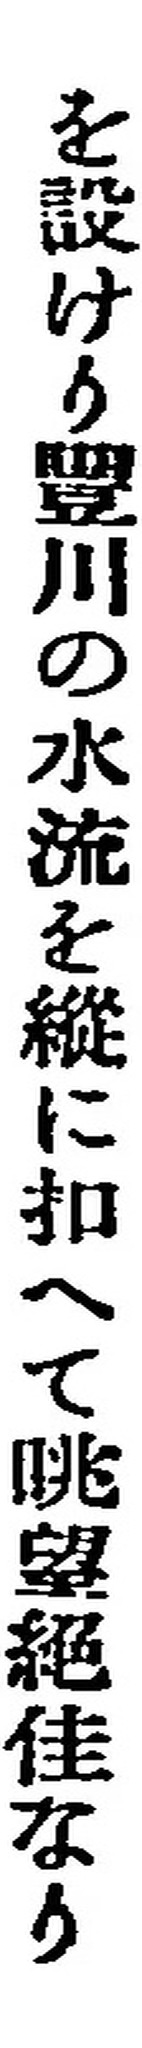を設けり豐川の水流を縦に扣へて眺望絕佳なり
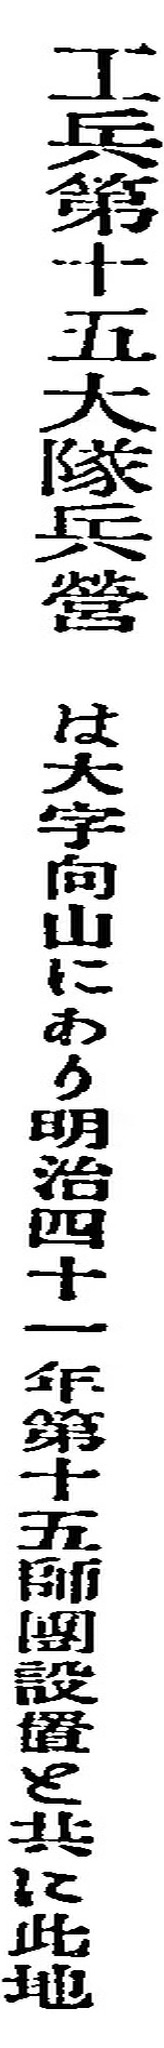工兵第十五大隊兵營は大字向山にあり明治四十一年第十五師團設置と共に此地
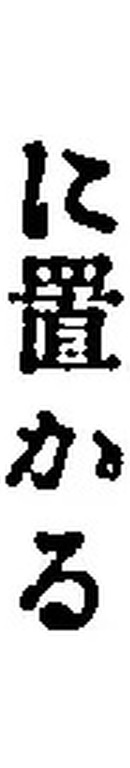に置かる
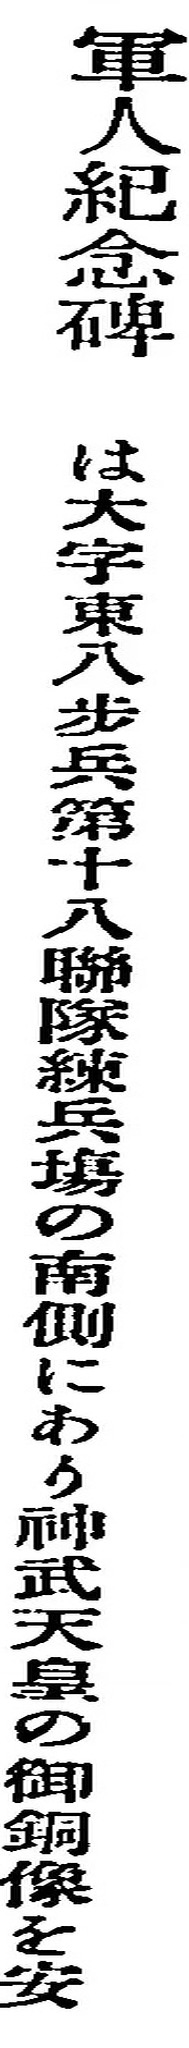軍人紀念碑は大字東八歩兵第十八聯隊練兵場の南側にあり神武天皇の御銅像を安
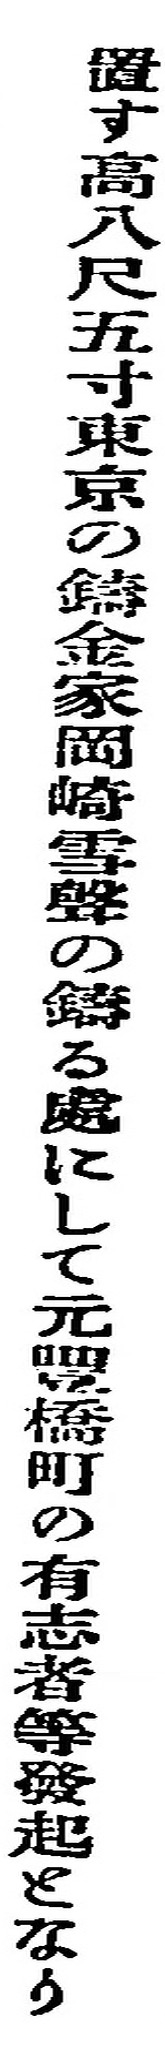置す高八尺五寸東京の鑄金家岡崎雪聲の鑄る處にして元豐橋町の有志者ら發起となり
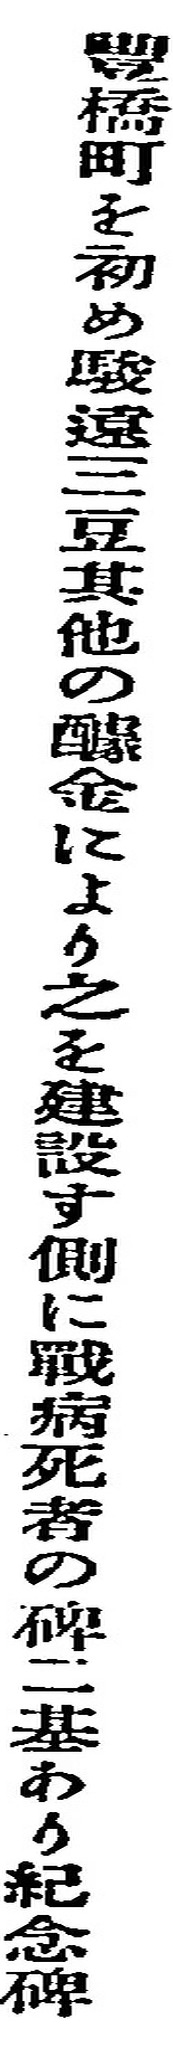豐橋町を初め駿遠三豆其他の醵金により之を建設す側に戰病死者の碑二基あり紀念碑
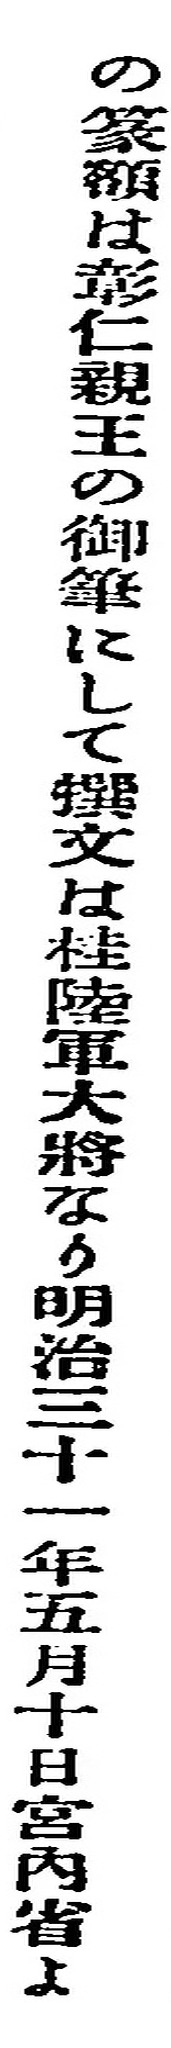の篆額は彰仁親王の御筆にして撰文は桂陸軍大將なり明治三十一年五月十日宮内省よ
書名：豊橋志要
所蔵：国立国会図書館 National Diet Library, JAPAN
